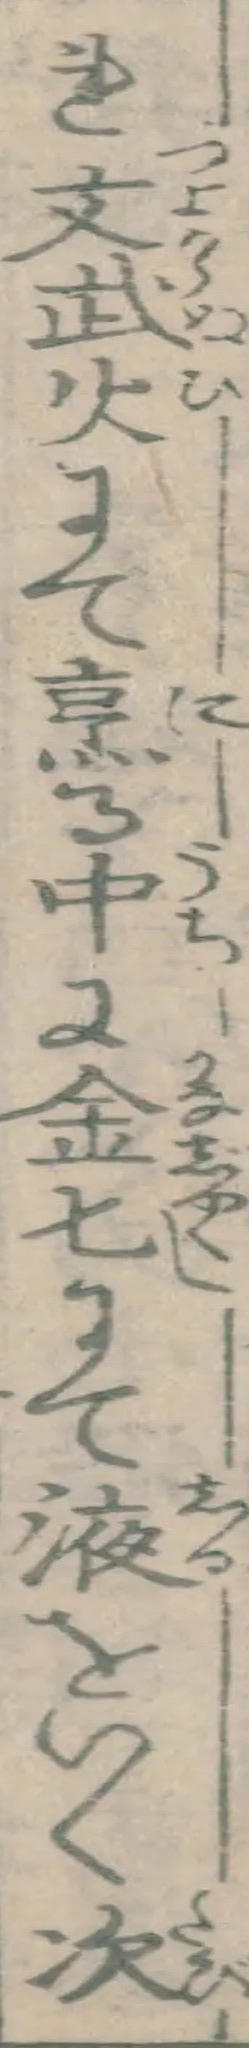れ文武火にて烹る中に金匕にて液をいく次
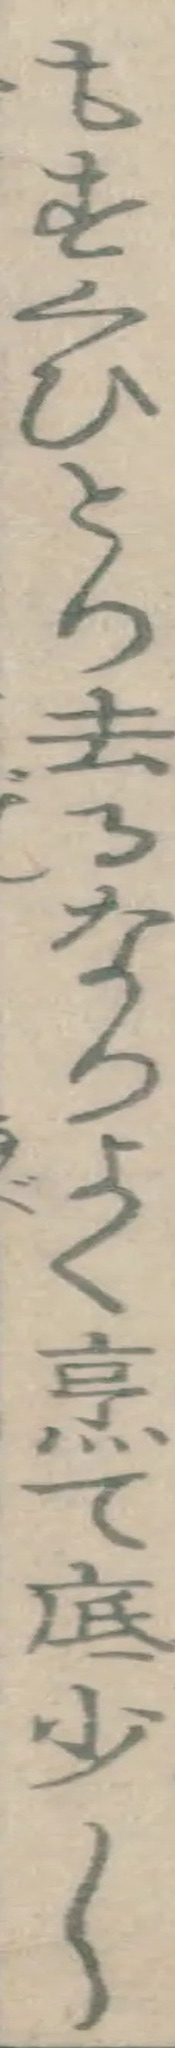もすくひとり去るなりよく烹て底少し
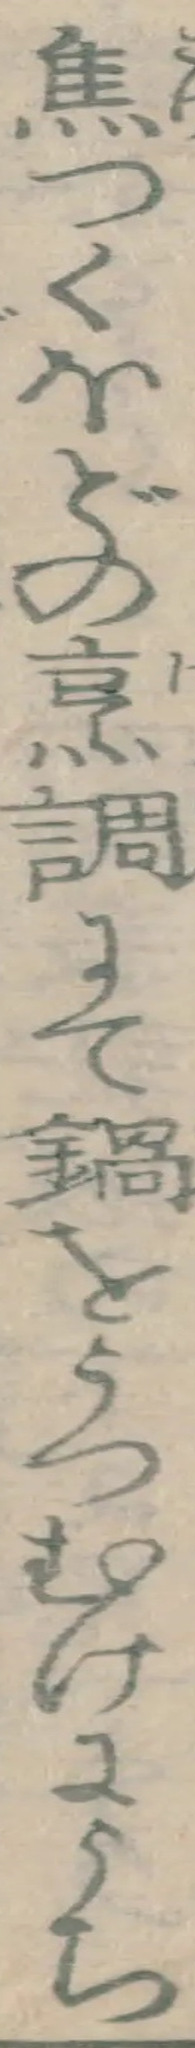焦つくほどの烹調にて鍋をうつむけにうち
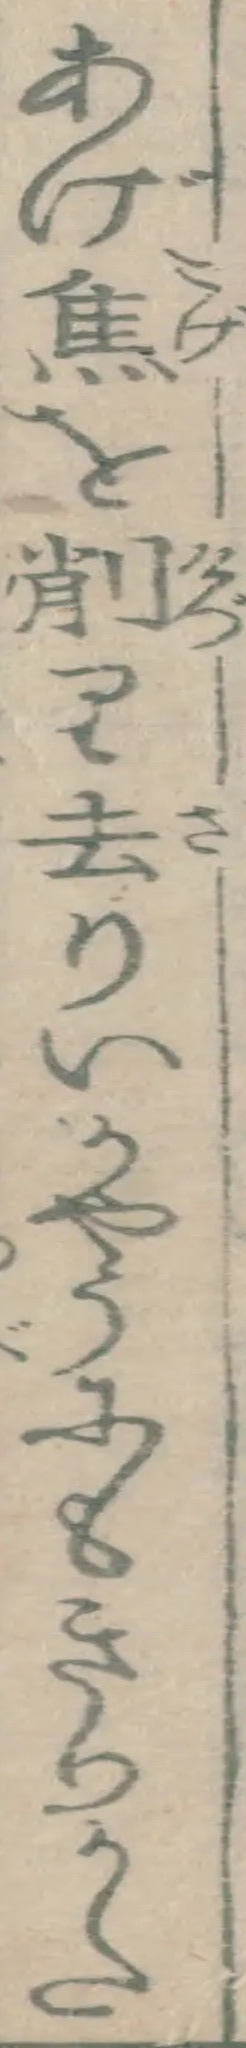あげ焦を削り去りいかやうにもきりかた
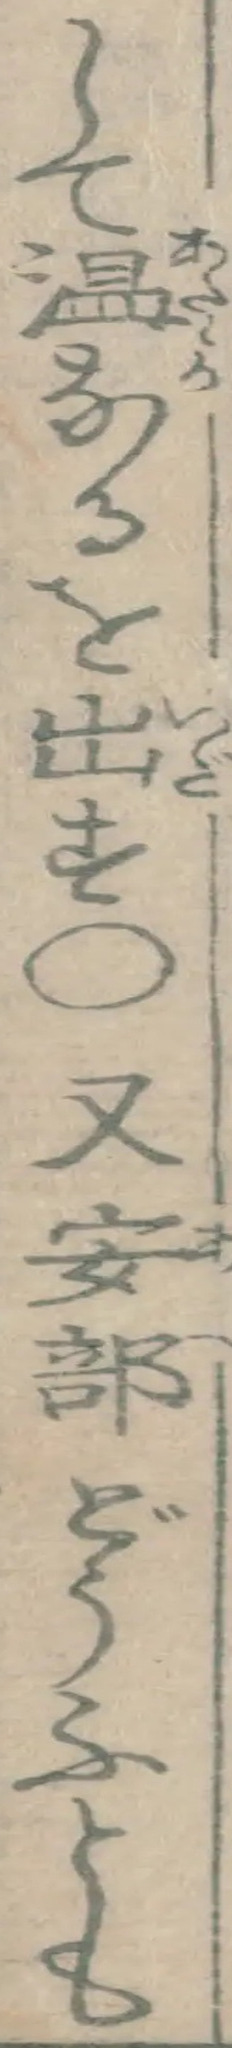して温なるを出す○又安部どうふとも

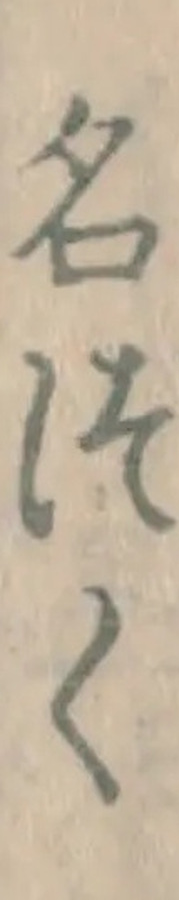名つく
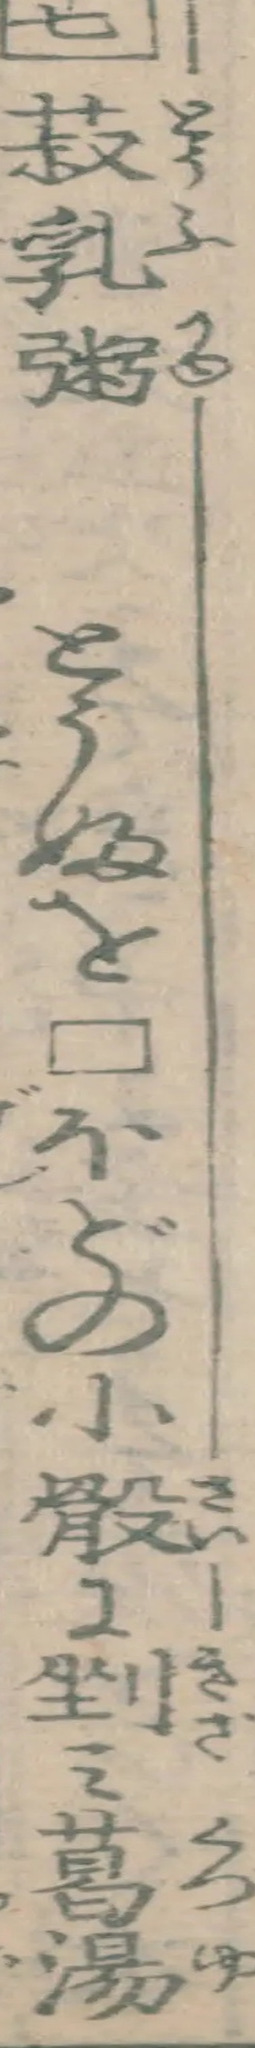八十七菽乳粥とうふをほどの小骰に剉み葛湯
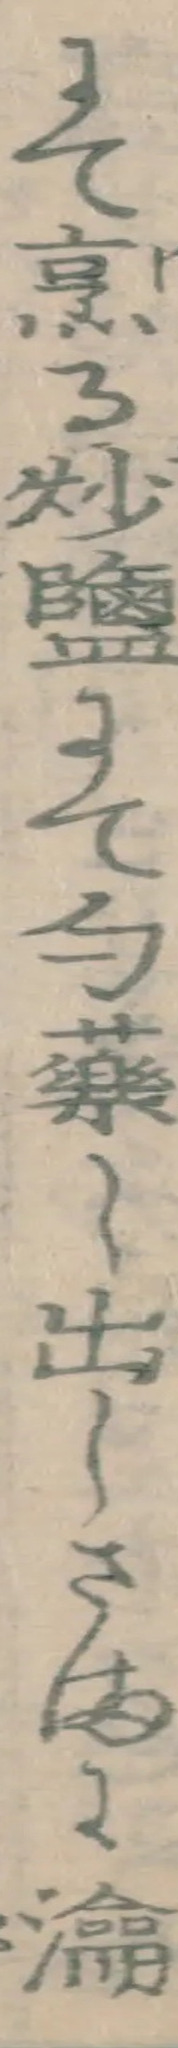にて烹る炒塩にて勺薬し出しさまに瀹
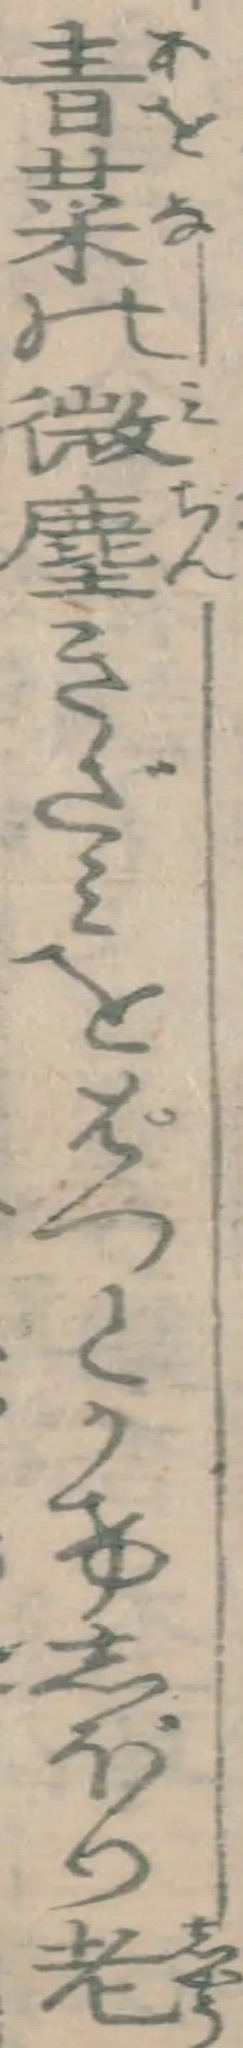青菜の微塵きざみをばつとかけしぼり老
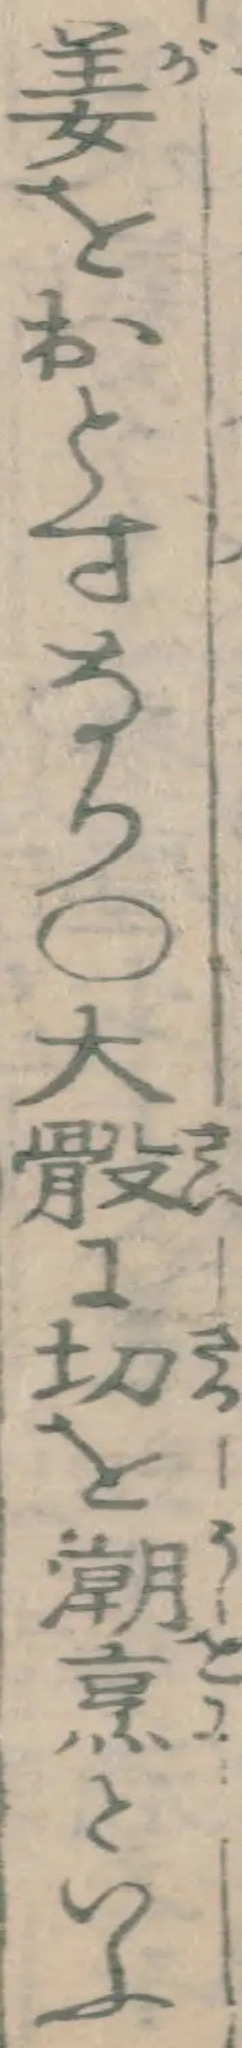姜をおとすなり○大骰に切を潮烹といふ
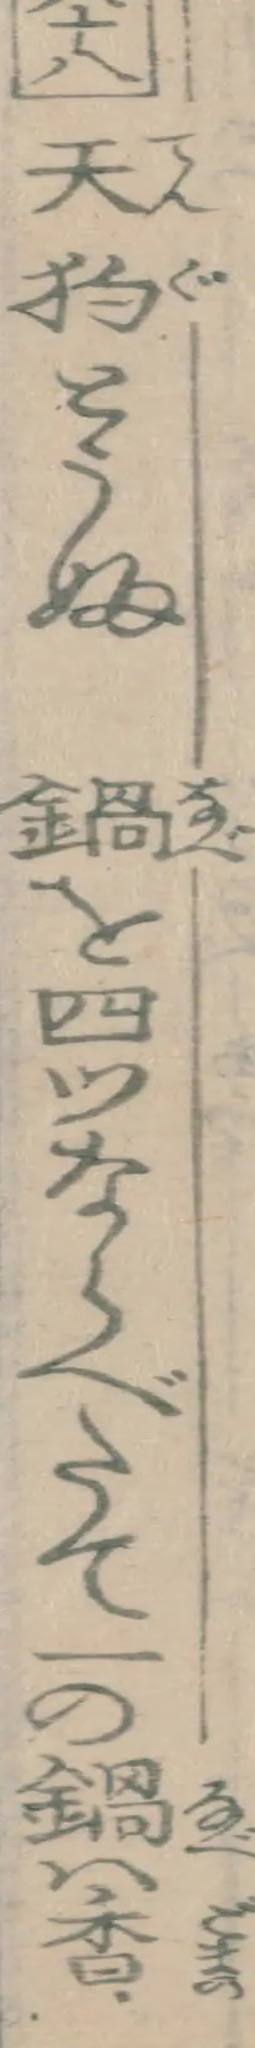八十八天狗とうふ鍋を四つならべたて一の鍋は香
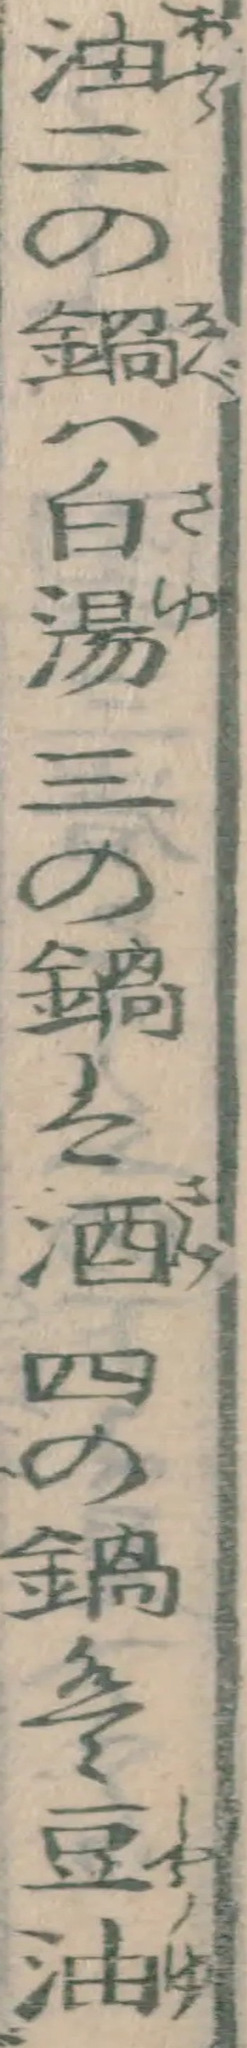油二の鍋は白湯三の鍋は酒四の鍋は豆油
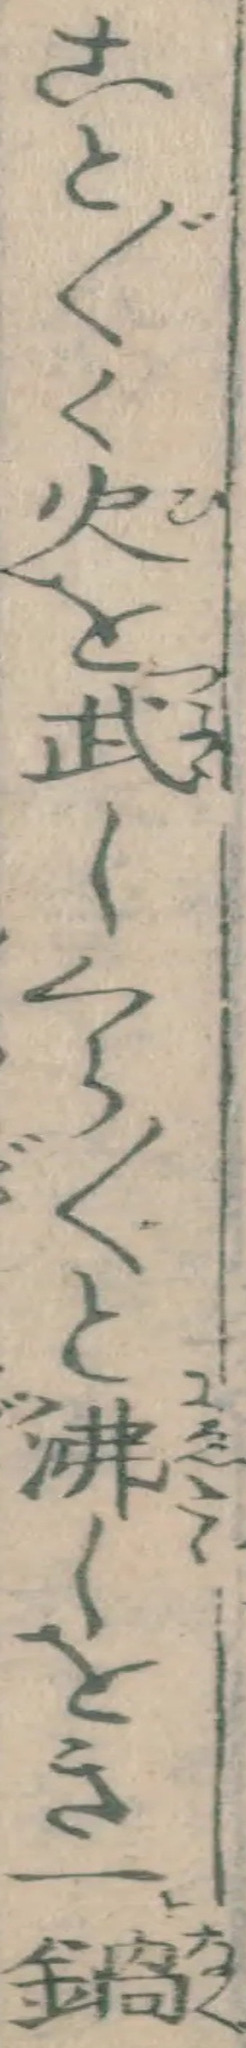こと〴〵く火を武しくら〳〵と沸しをき一鍋
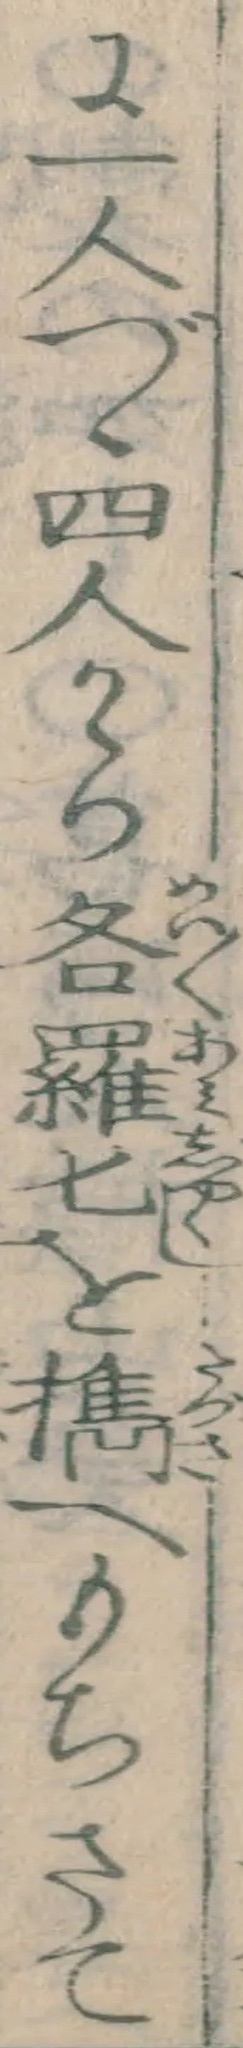に一人づゝ四人かゝり各羅匕を携へもちさて
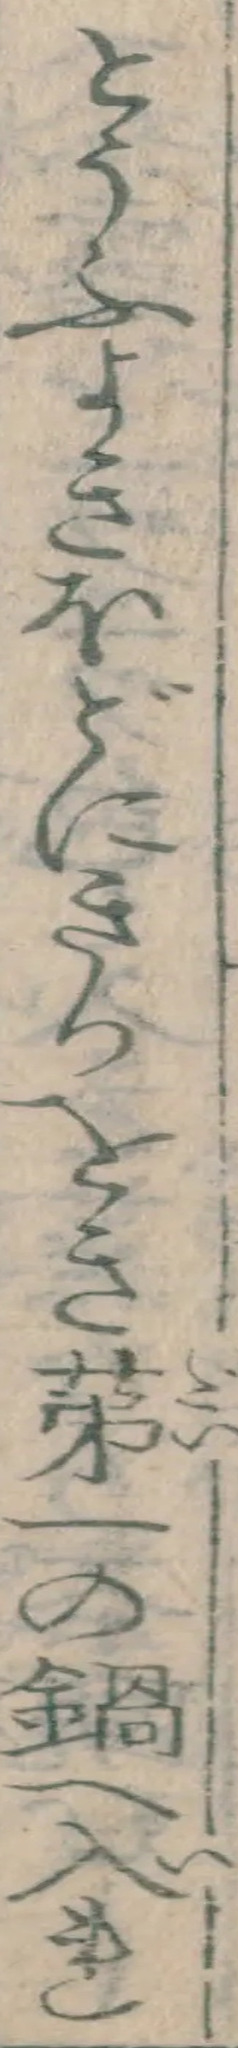とうふよきほどにきりをき第一の鍋へ入れ
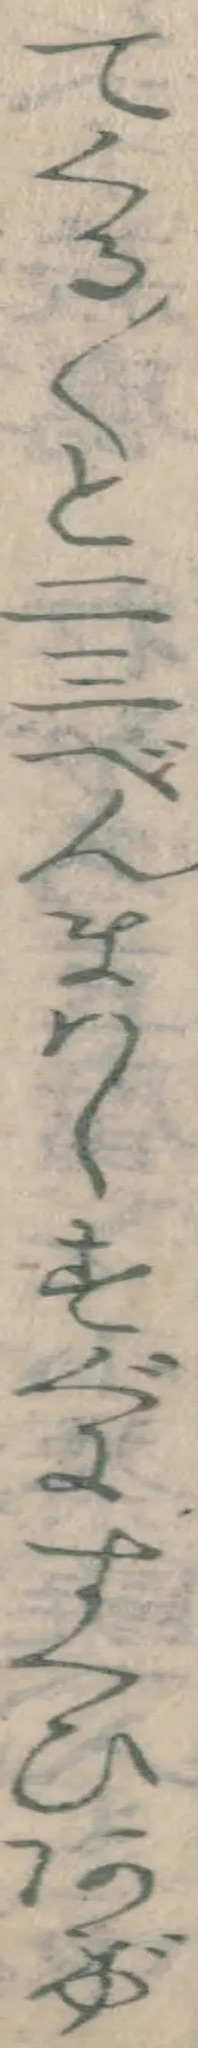てくる〳〵と二三べんまはしすぐにすくひあげ
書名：豆腐百珍. 続編
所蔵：国立国会図書館 National Diet Library, JAPAN
